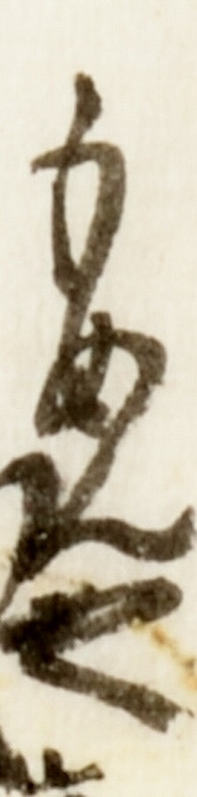もめんや
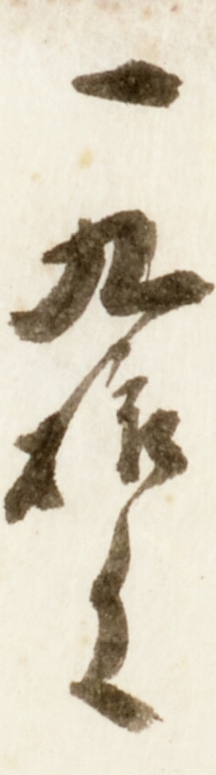一九拾文
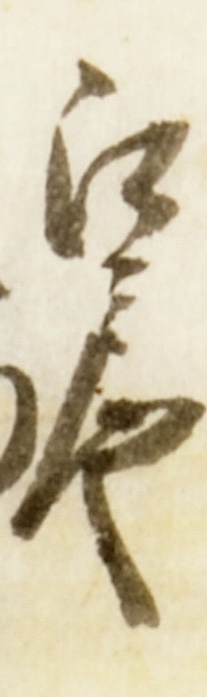江とや
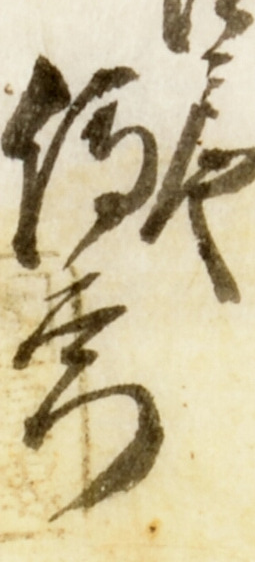傳右衛門
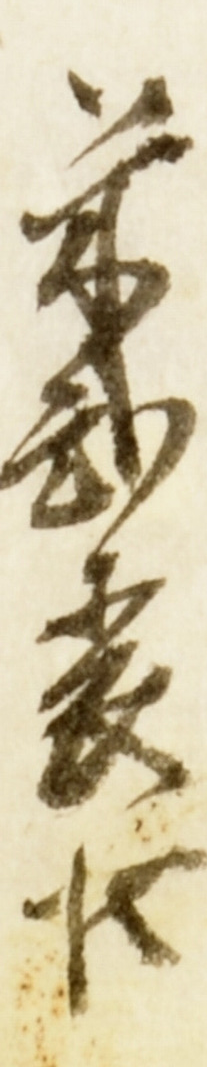米弐表代
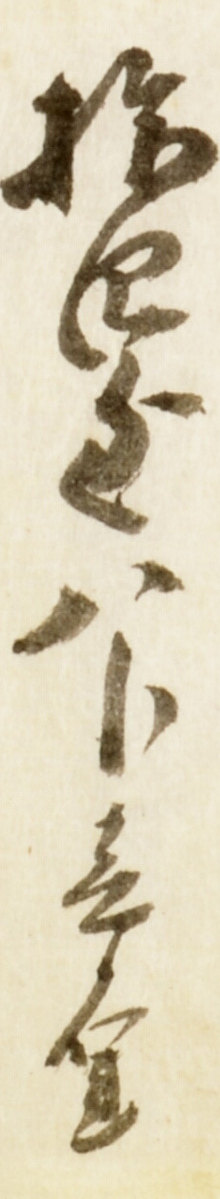拾四匁八分壱厘
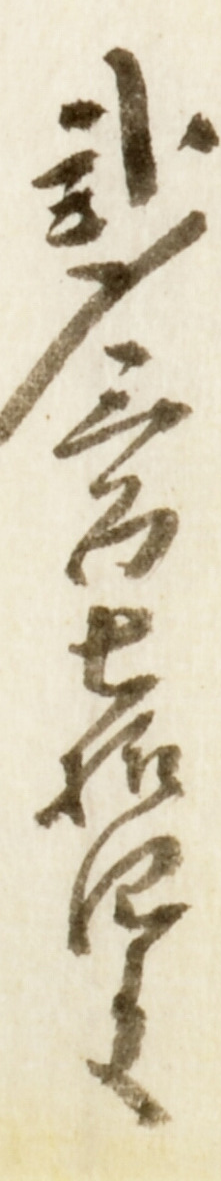弐貫三百七拾四文

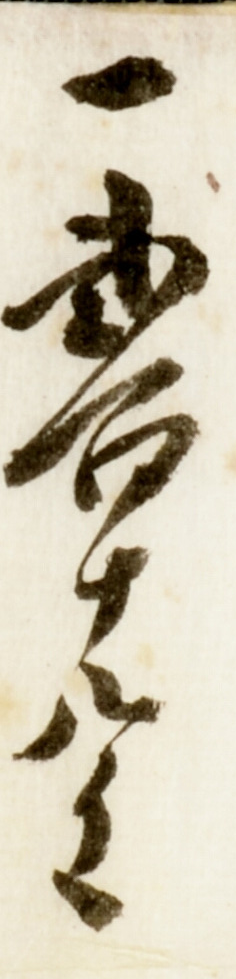一弐百十八文
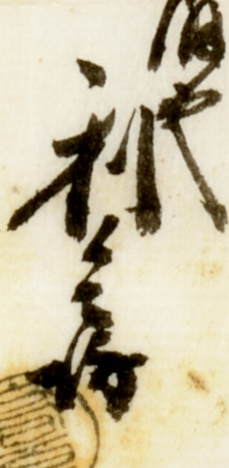利兵衛
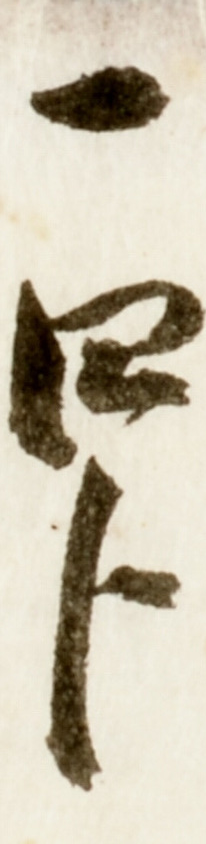一四分
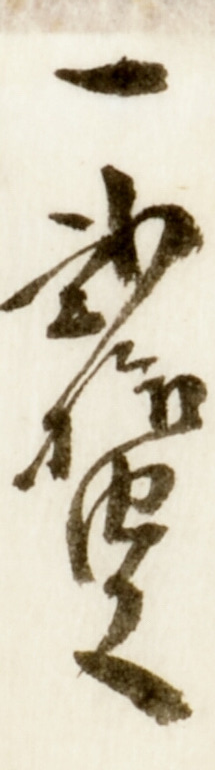一弐拾四文
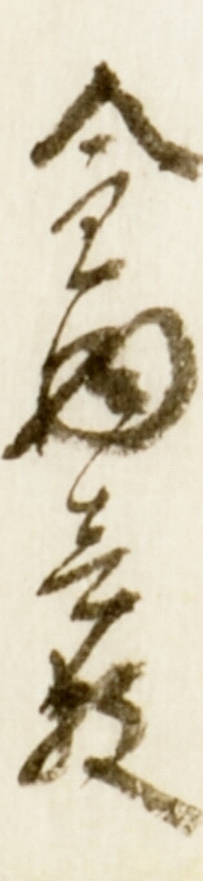金物壱枚

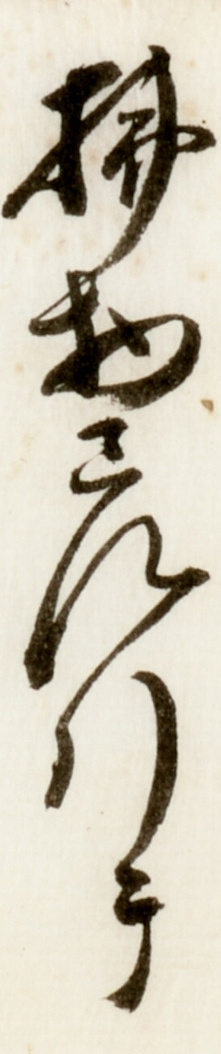払物差引テ
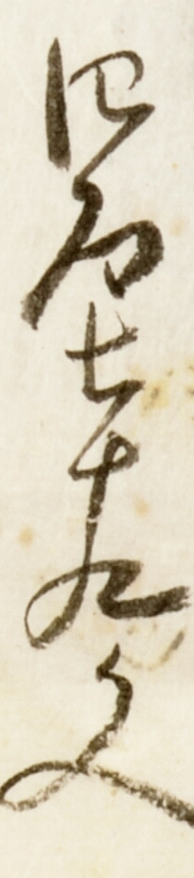四百七十九文
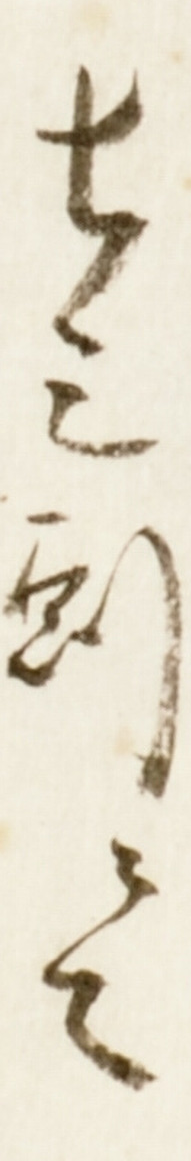七三割にて
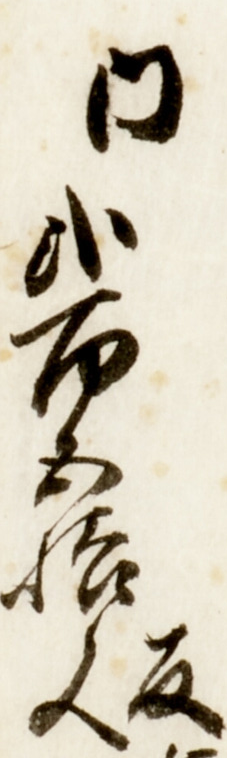内弐百五拾文引
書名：御賄諸色控帳
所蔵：伊那市立高遠町図書館・合同会社AMANE
